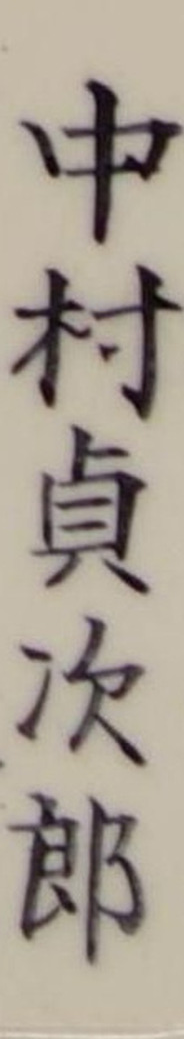中村貞次郎
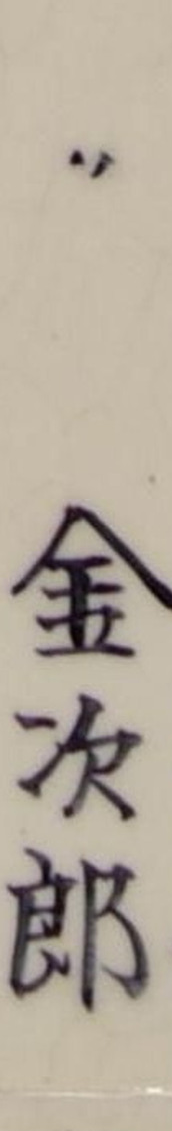金次郎
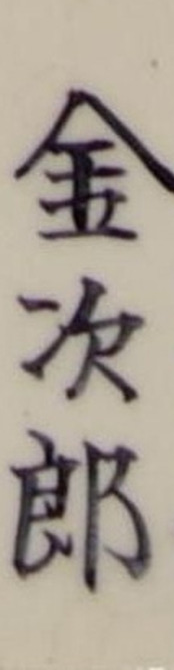金次郎
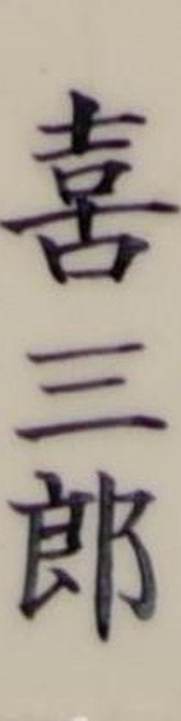喜三郎
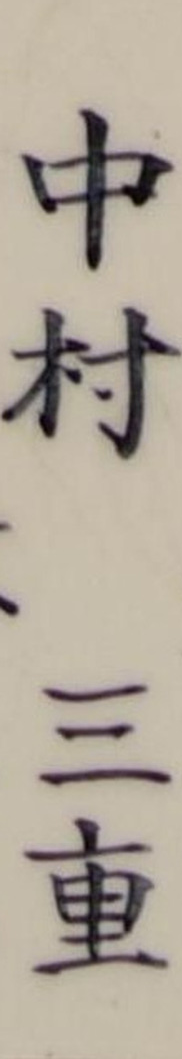中村三重
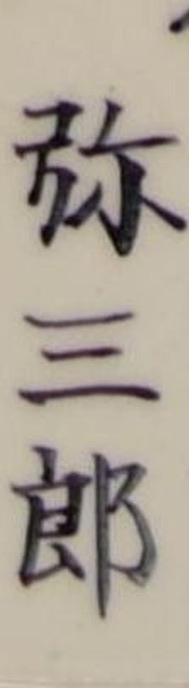弥三郎
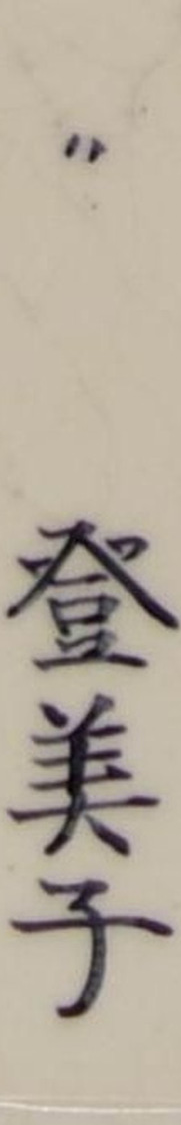登美子
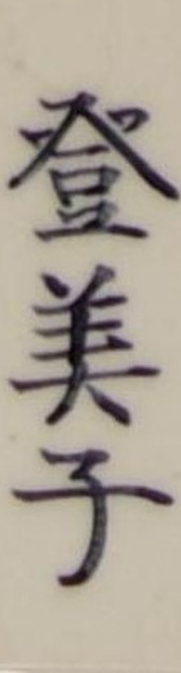登美子
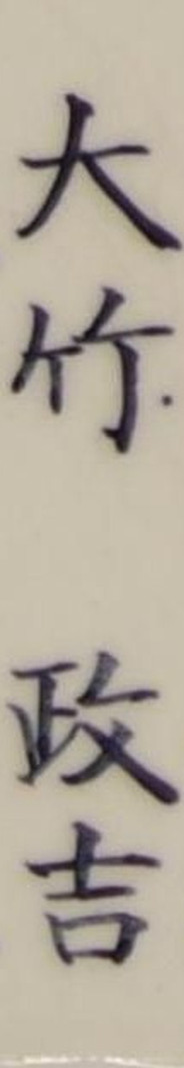大竹政吉

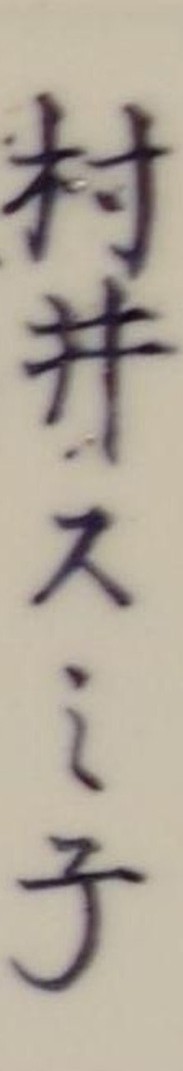村井ス之子
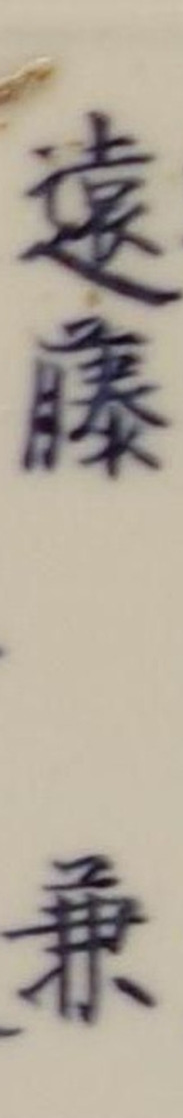遠藤兼
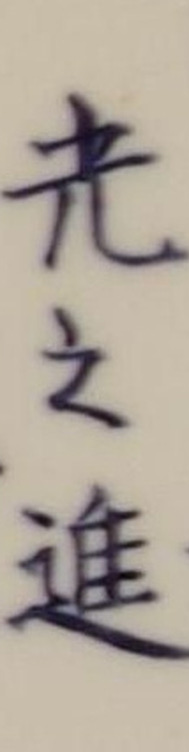光之進
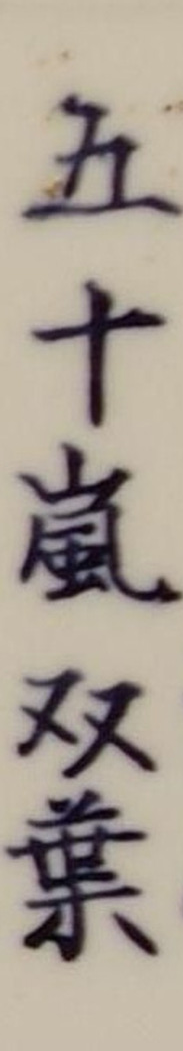五十嵐双葉
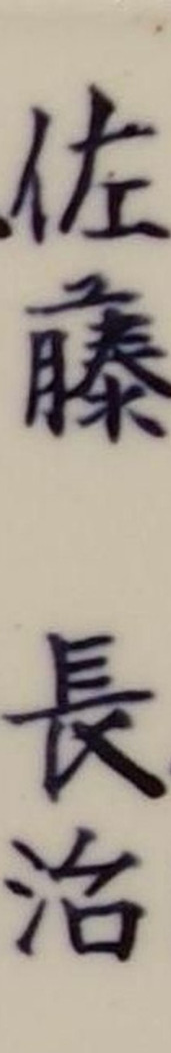佐藤長治
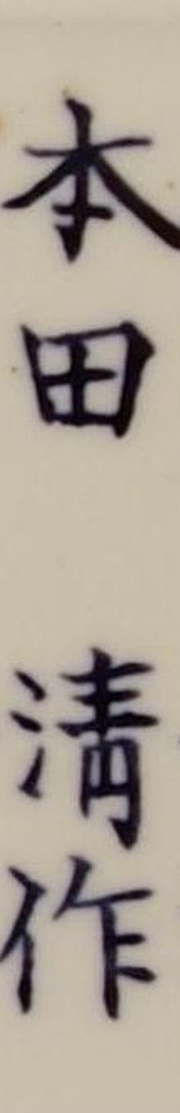本田清作
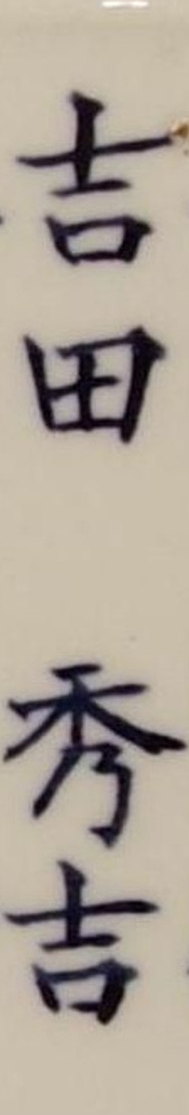吉田秀吉
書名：E~L
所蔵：高野山金剛峯寺
